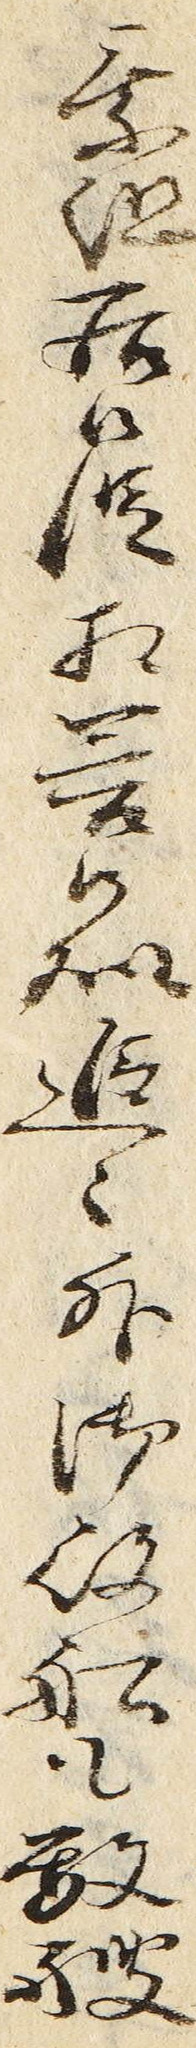乗組居候段相答候処追々外御役船も数艘
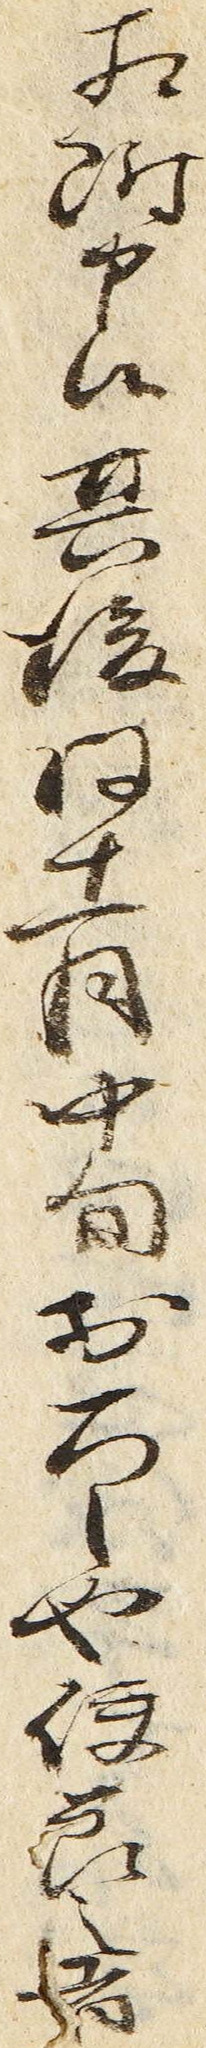相附申候其後同十一月中旬おろしや使節之者
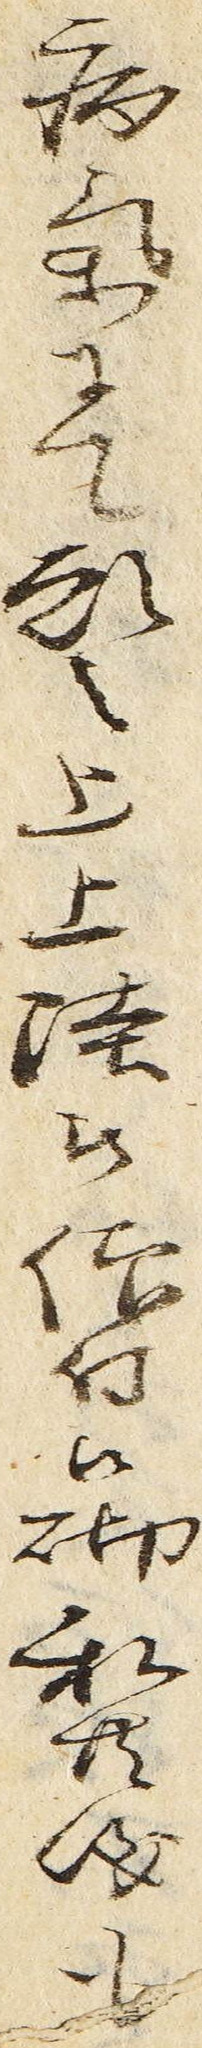病気にて願之上上陸被仰付候砌私共儀も
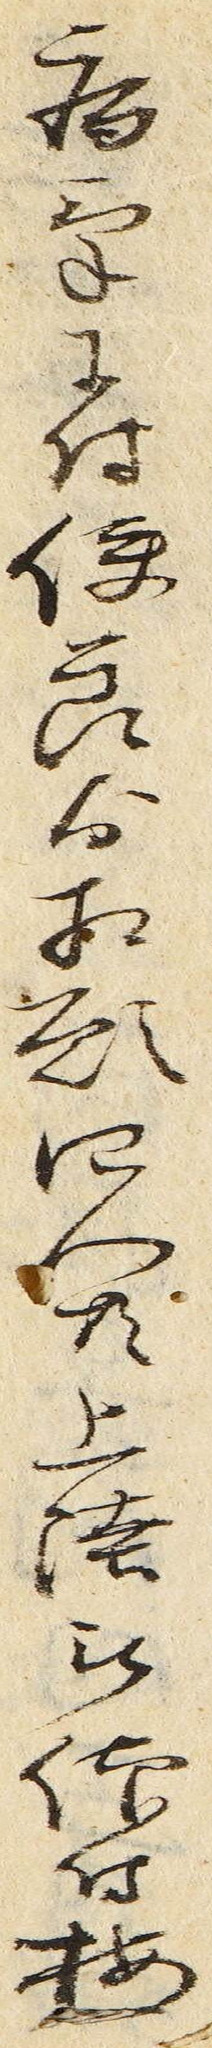病気に付使節ゟ相願四人共上陸被仰付梅

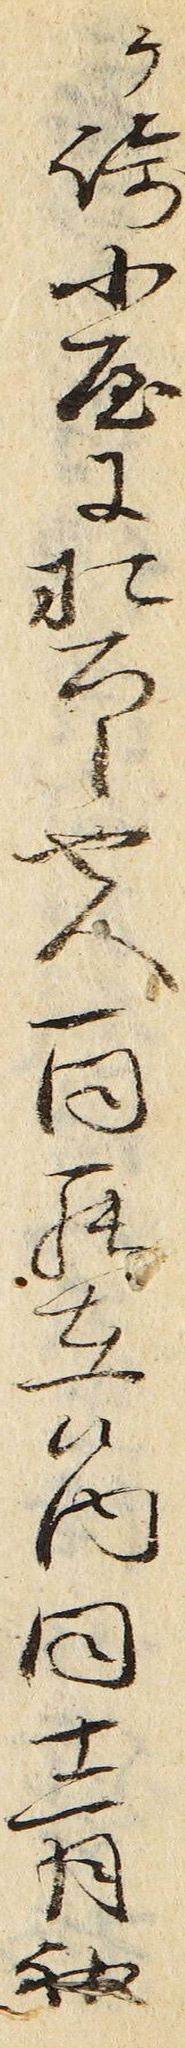ヶ崎小屋におろしや人一同罷在候内同十二月初
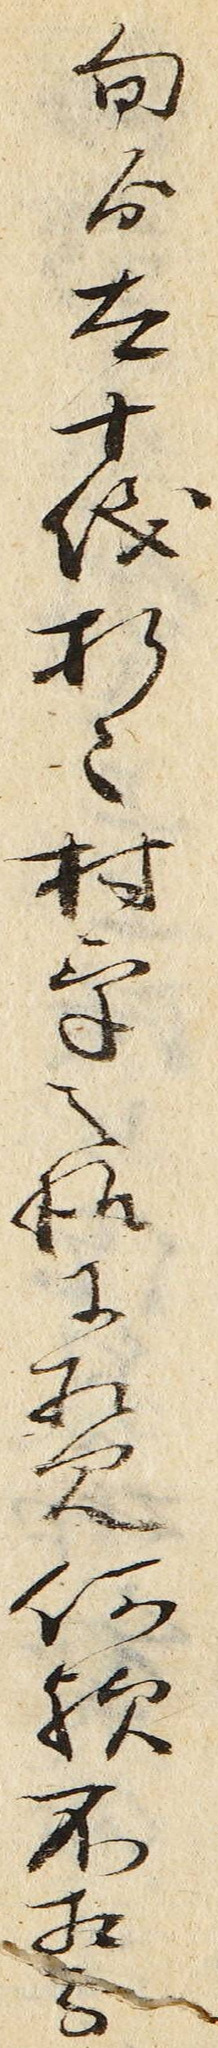旬ゟ太十儀折々村気之様子相見何歟不相分
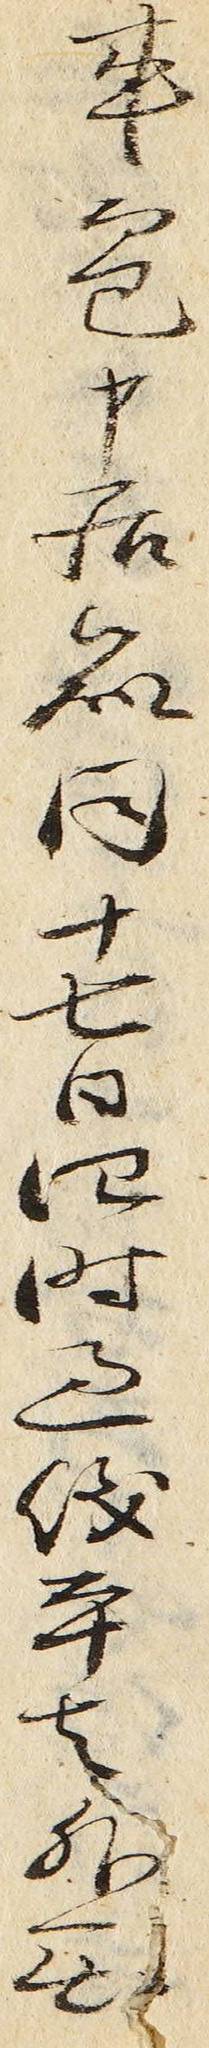事而已申居候処同十七日四時過儀平は外へ出
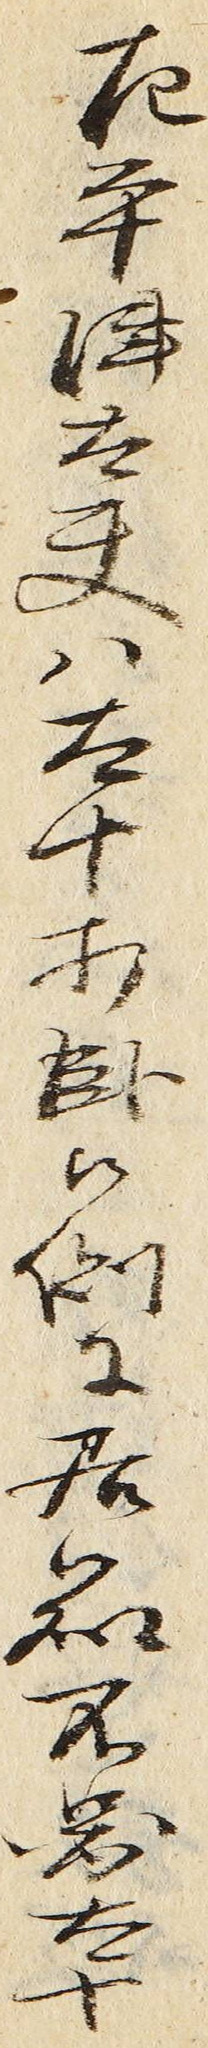左平津太夫は太十相臥候側に居候処不図太十
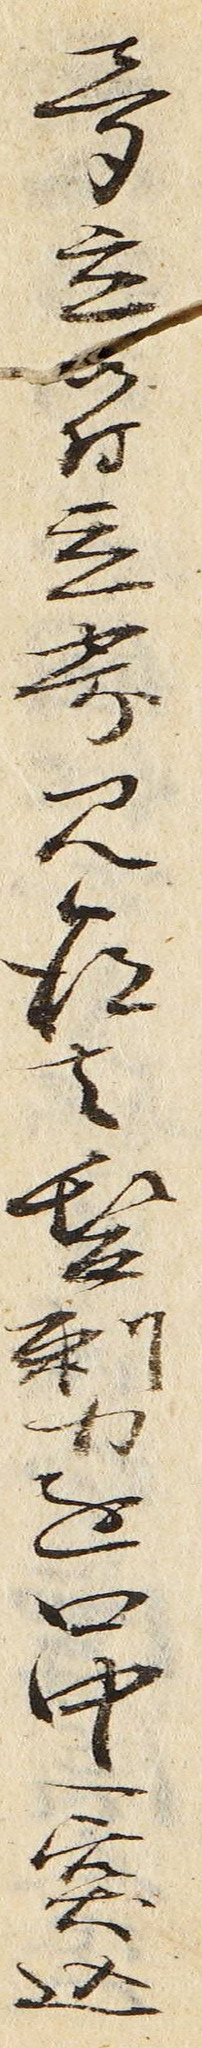声立候付立寄見候得は髪剃刀を口中へ突込
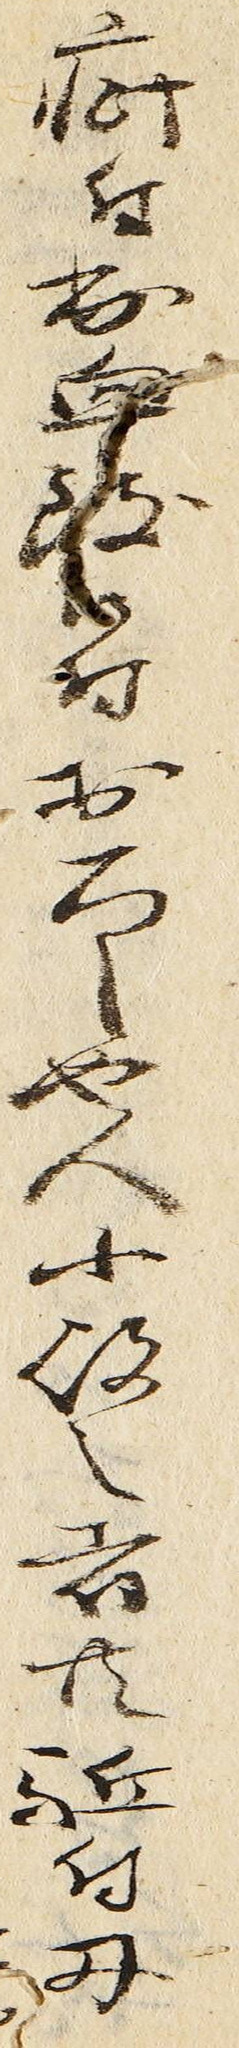疵付出血致候付おろしや人小役之者共駆付刃
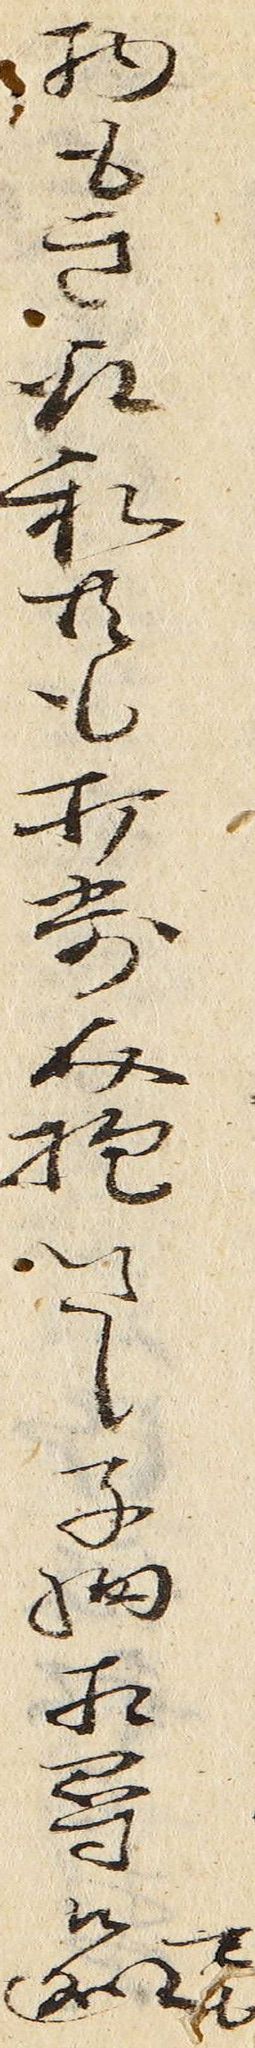物もき取私共も打寄介抱いたし子細相尋候処
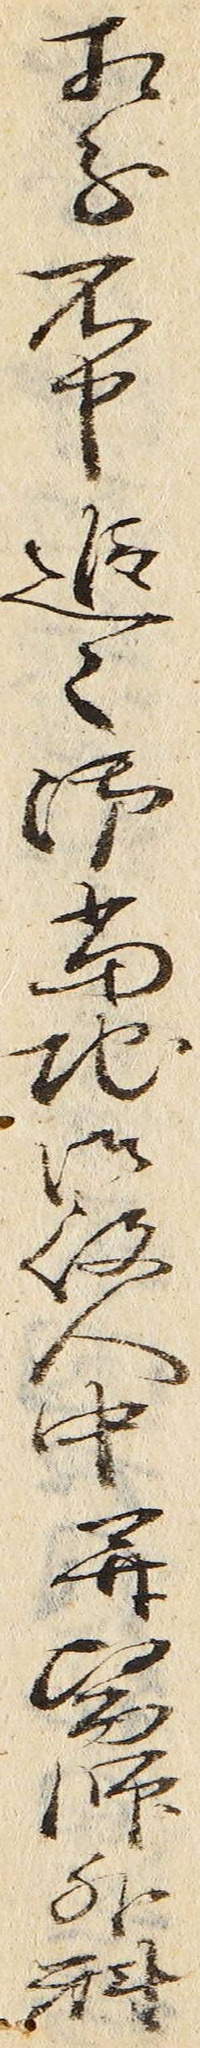相分不申追々御当地御役人中并医師外科
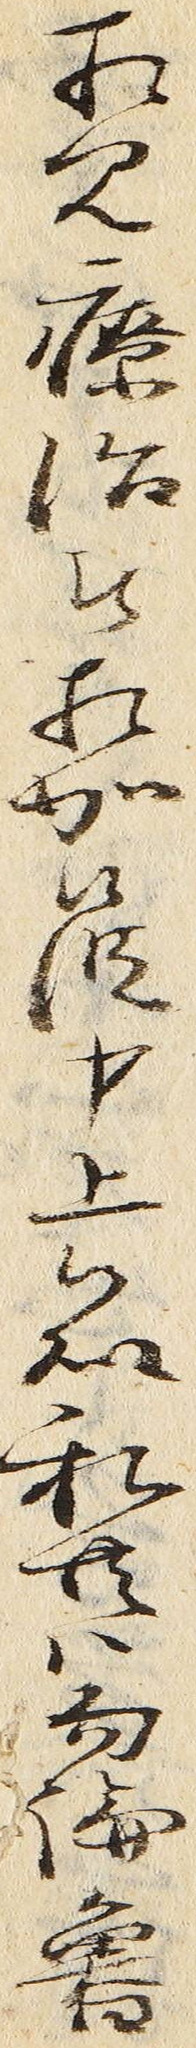相見療治被相加候段申上候処私共は勿論魯
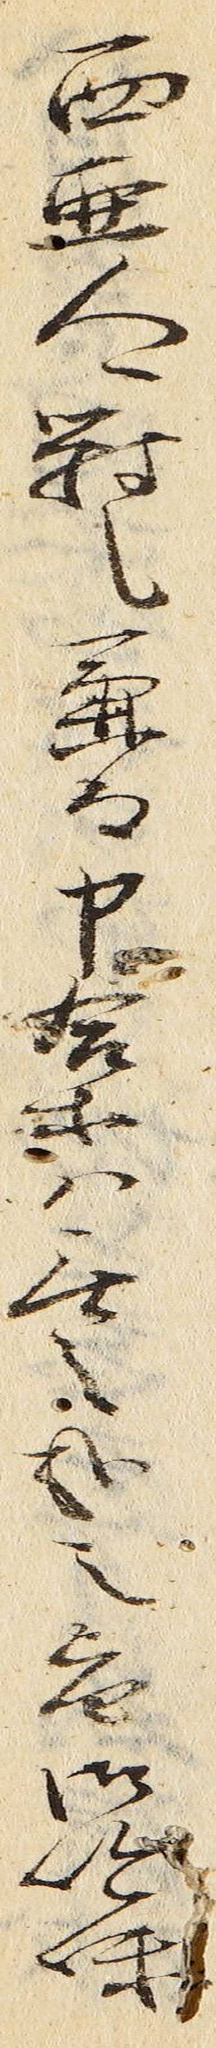西亜人へ対し兼て申合等は無之哉之旨御吟味
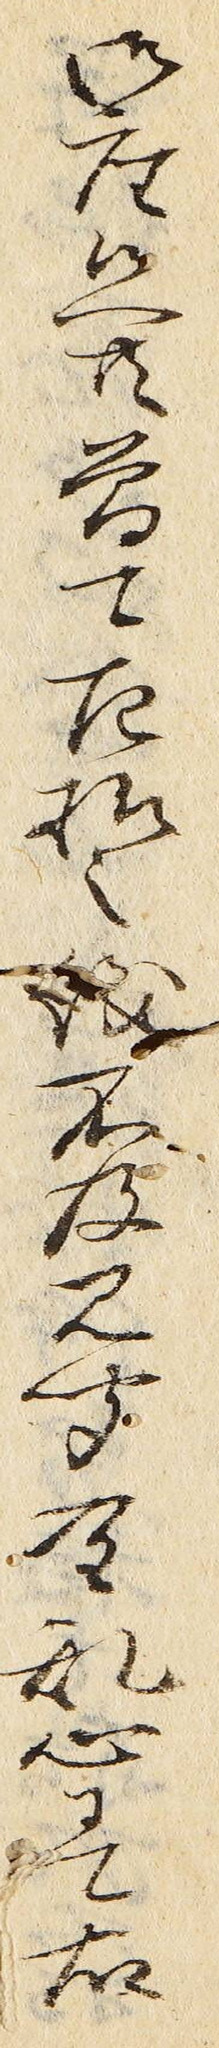御座候へ共曽て左様之儀不及見聞全乱心にて右
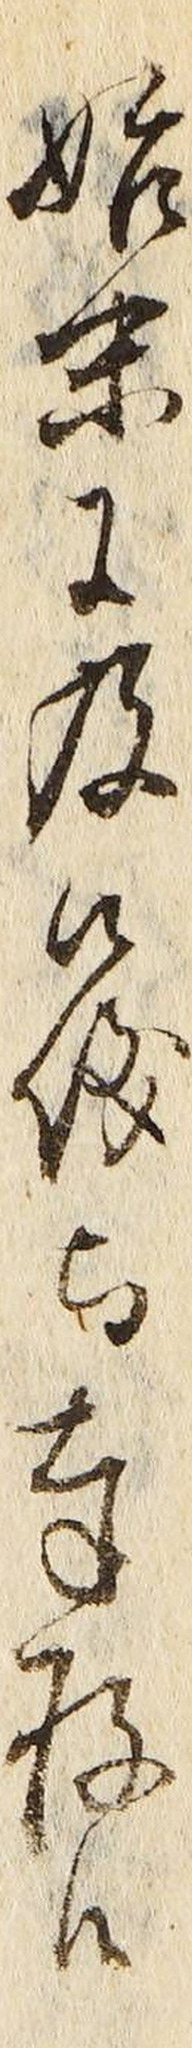始末に及候儀と奉存候
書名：漂民後記
